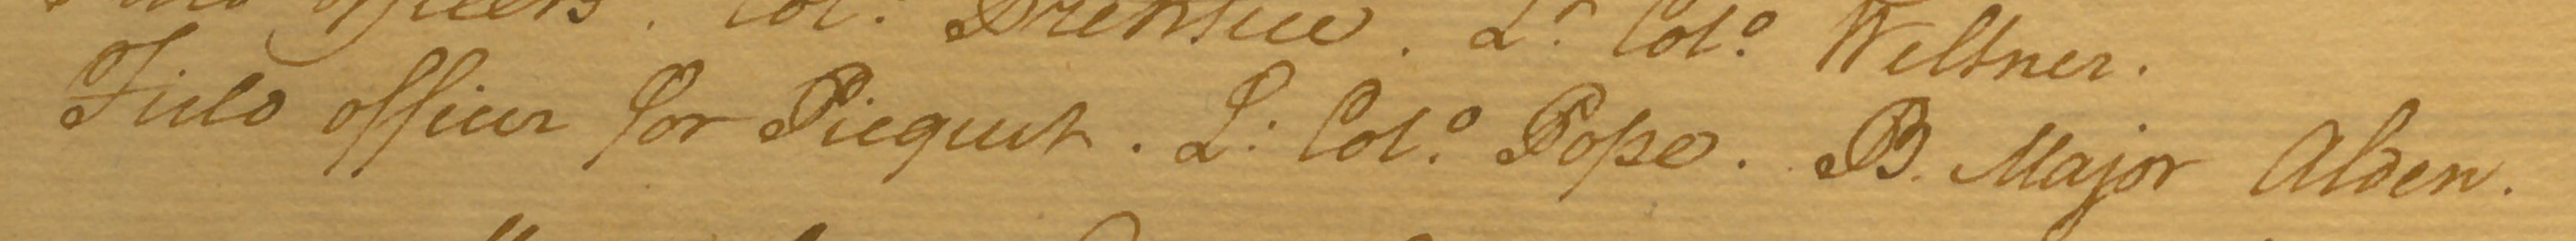Field officer for Picquet. L: Col^o. Pope. B Major Alden.
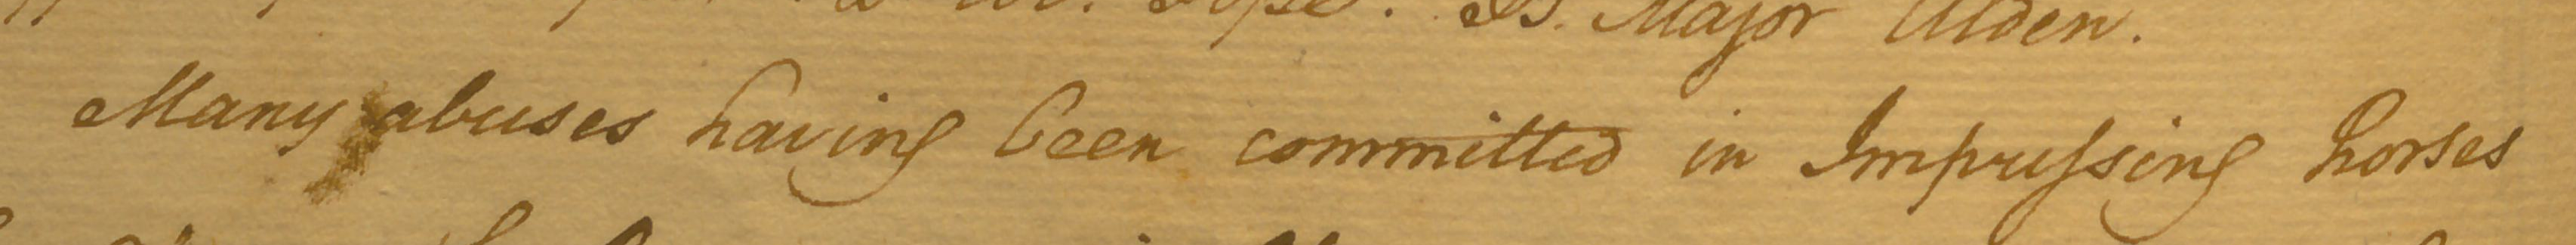Many abuses having been committed in Impressing horses
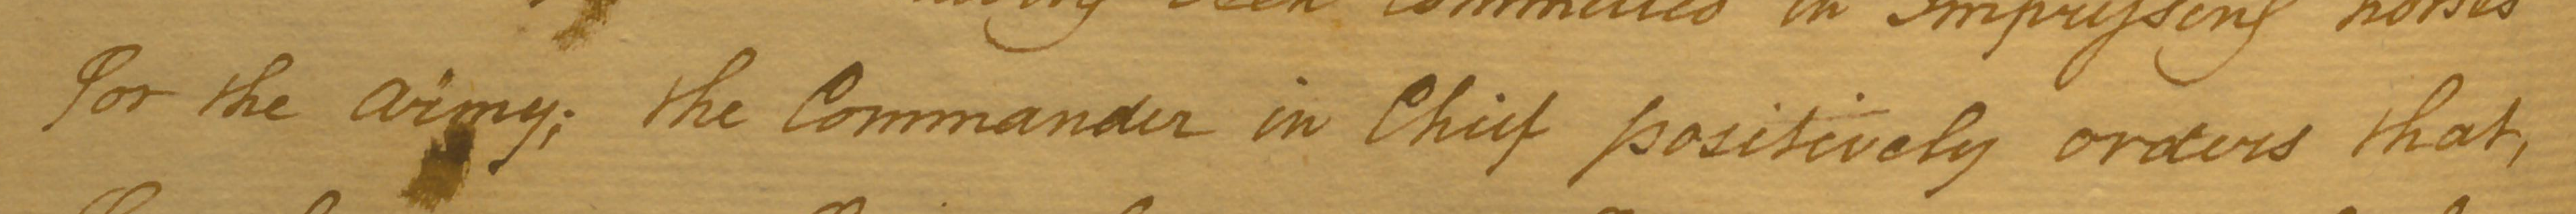for the army; the Commander in Chief positively orders that,
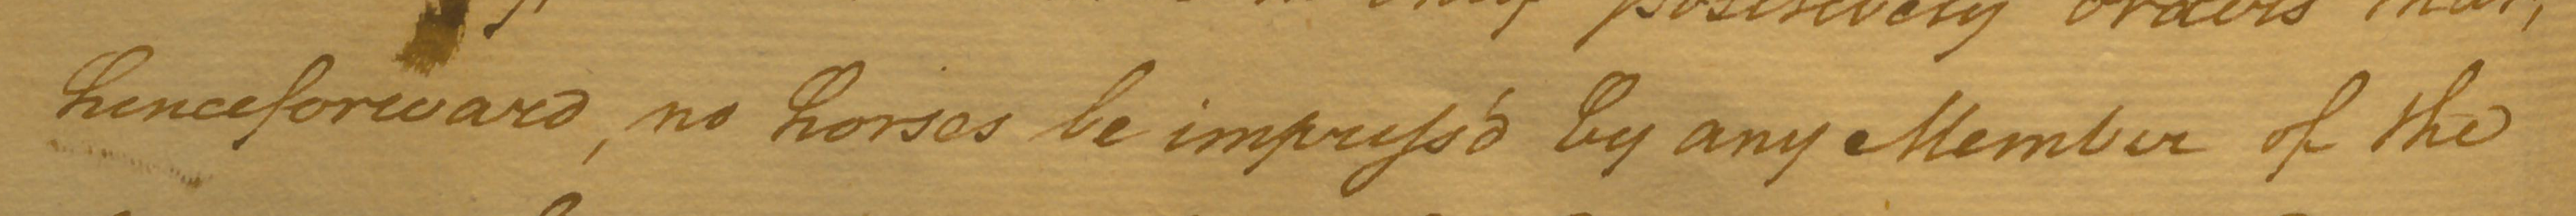henceforward, no horses be impress'd by any Member of the
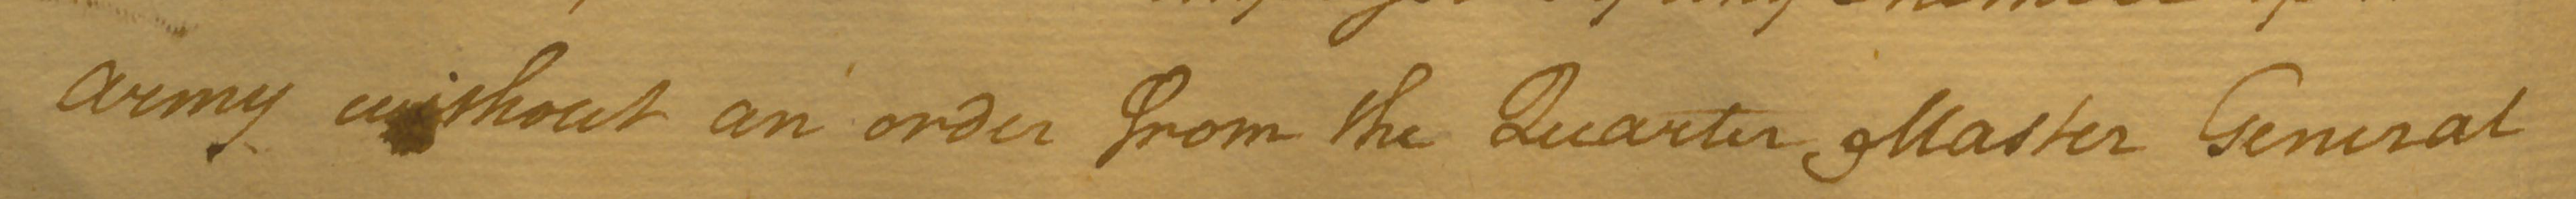army without an order from the Quarter Master General
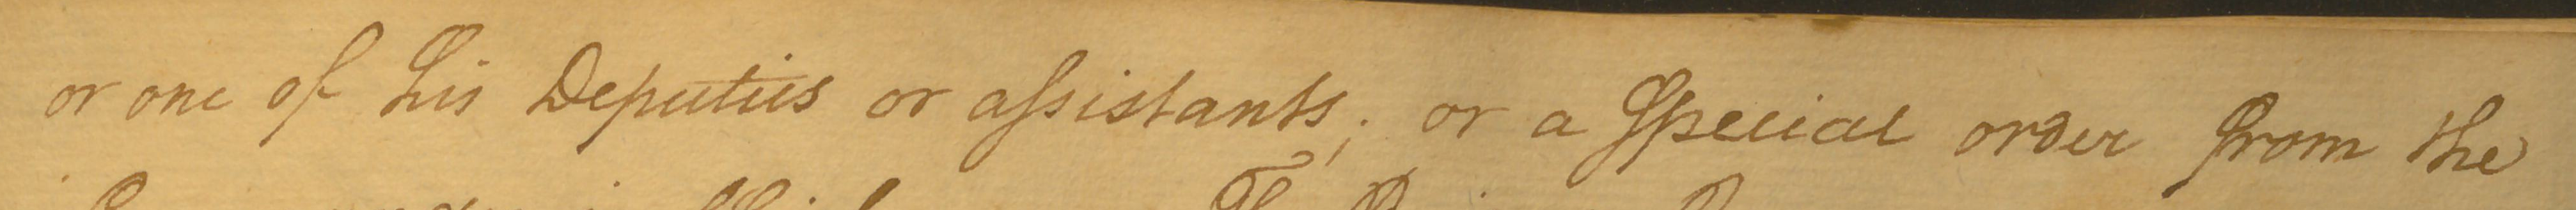or one of his Deputies or assistants; or a Special order from the
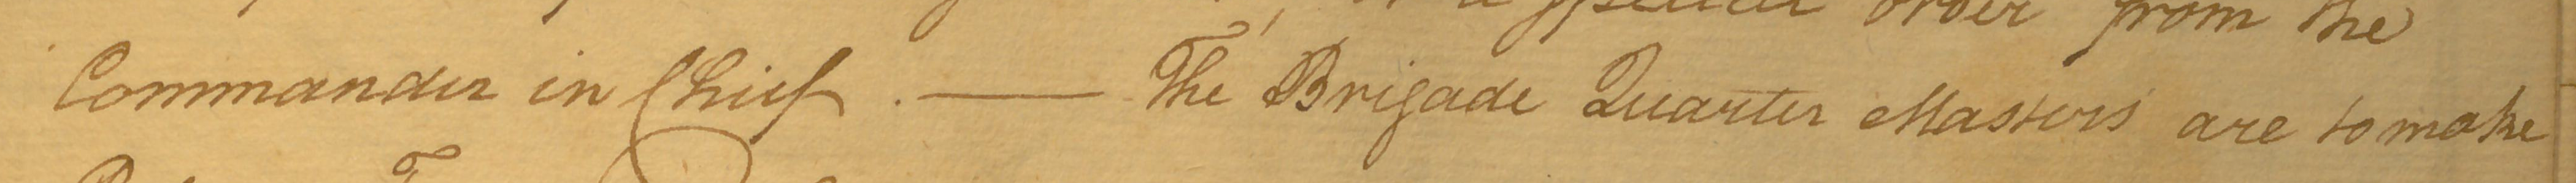Commander in Chief.- The Brigade Quarter Masters are to make
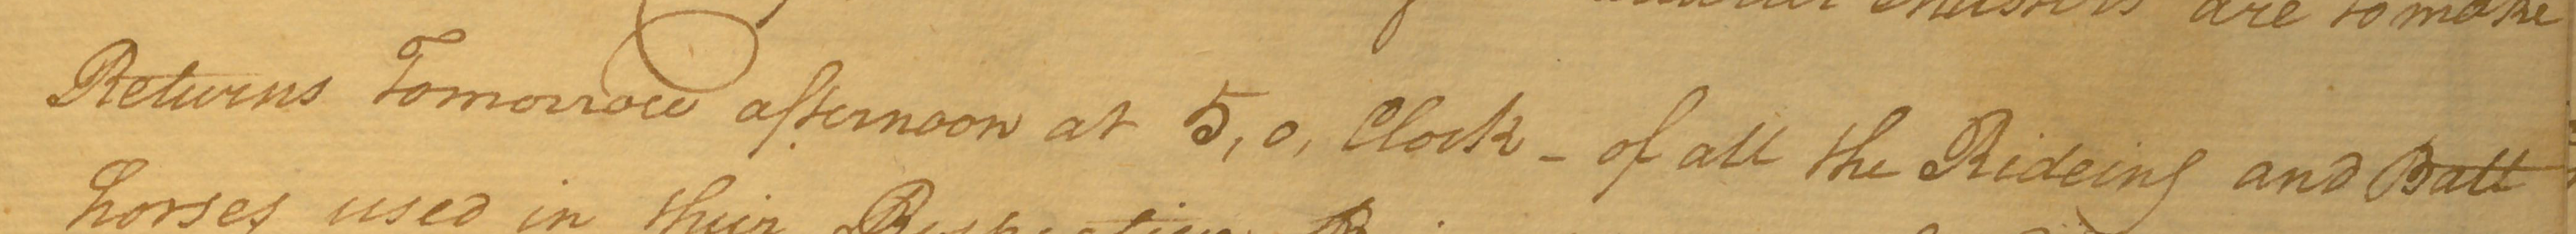Returns Tomorrow afternoon at 5, o,Clock- of all the Rideing and Batt
